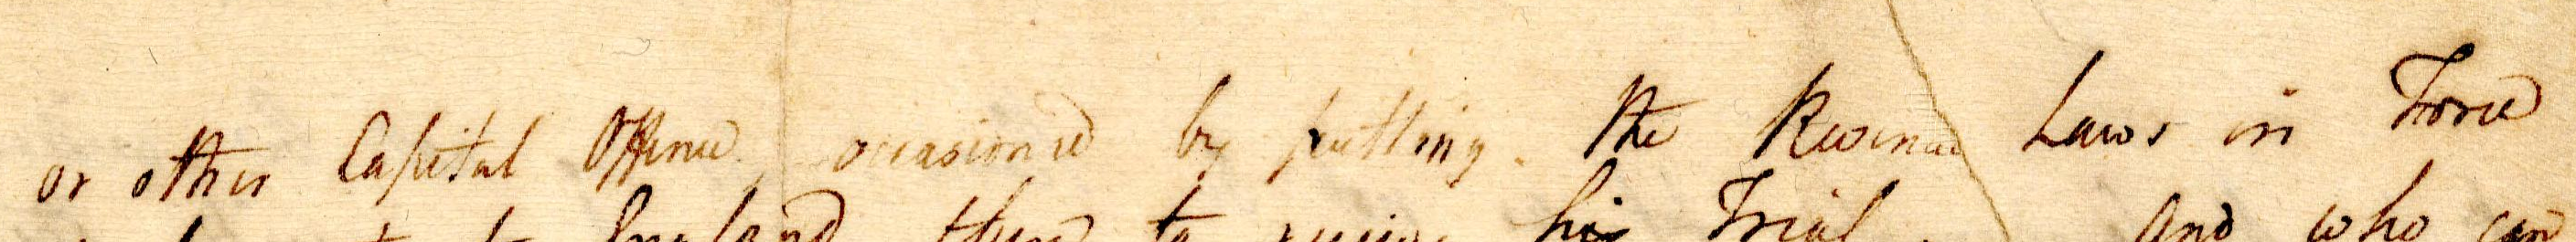or other Capital Offence occasioned by putting the Revenue Laws in Force
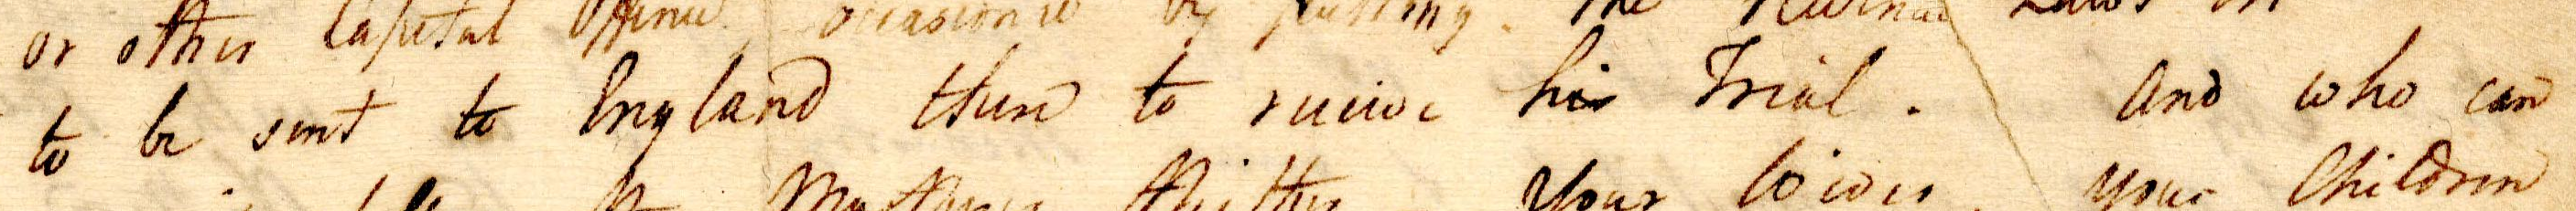to be sent to England there to receive his Trial. And who can
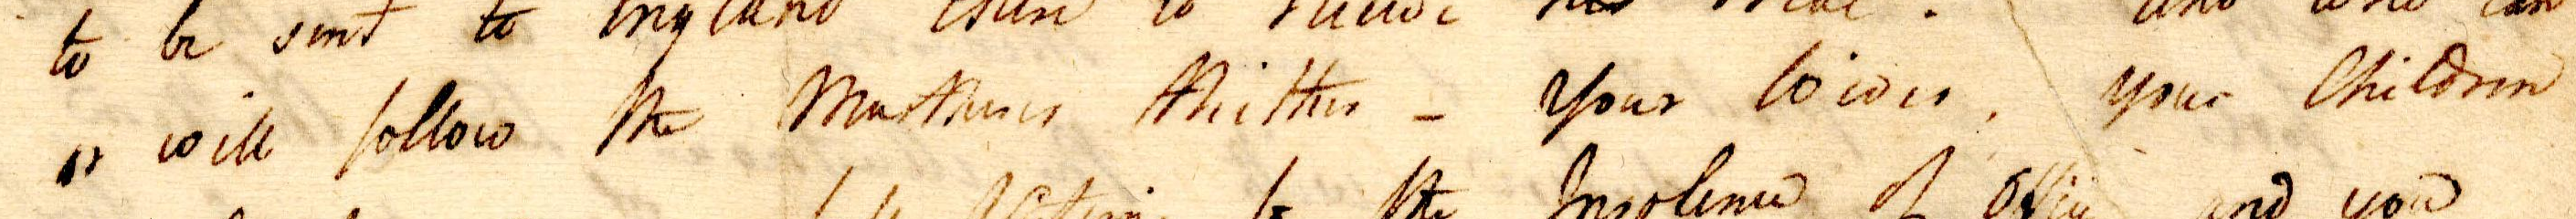or will follow the Mattheres thither- Your Wives, your children
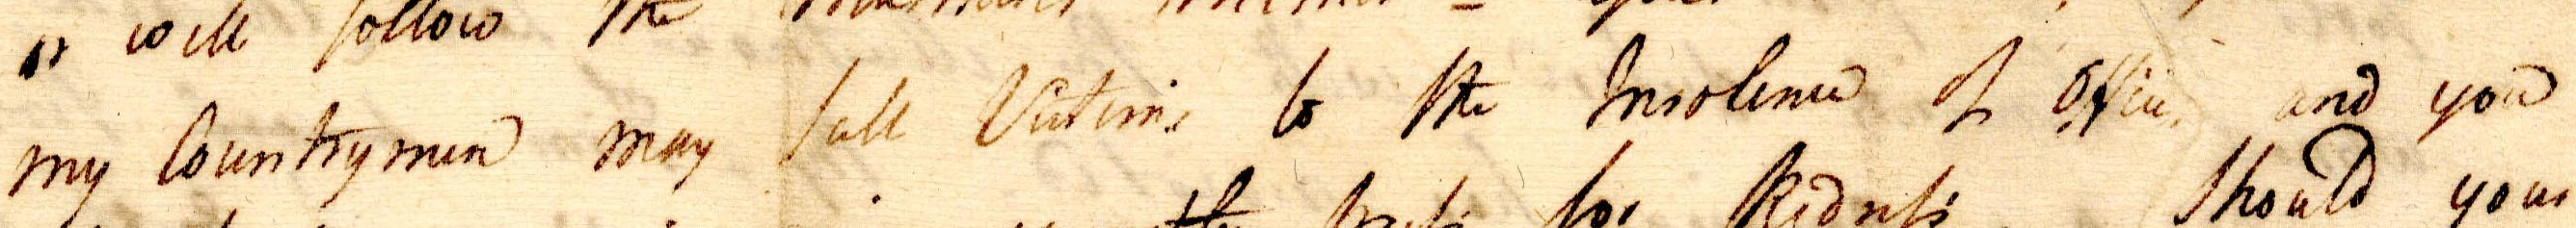my Countrymen may fall Victims to the Insolence of Office and you
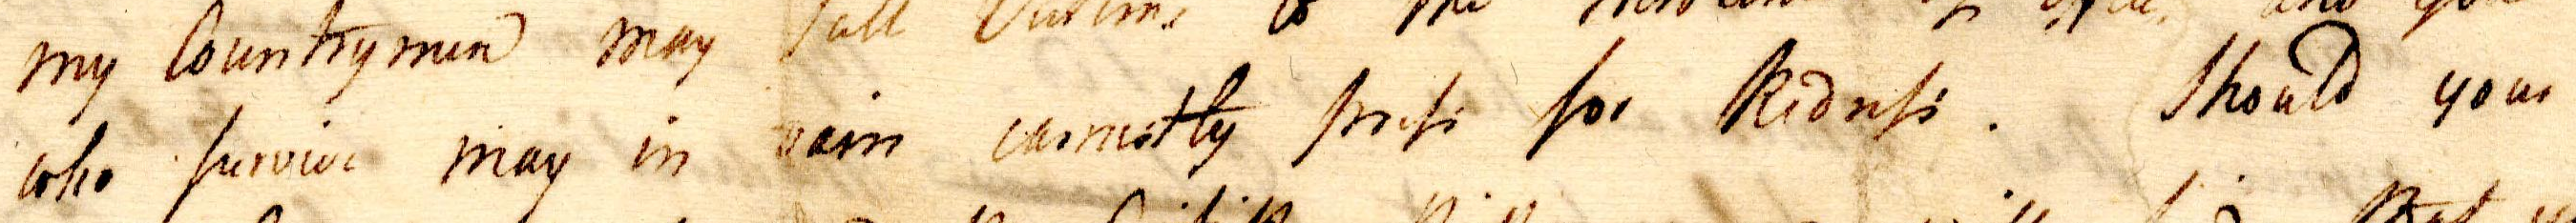who survive may in vain earnestly press for Redness. Should your
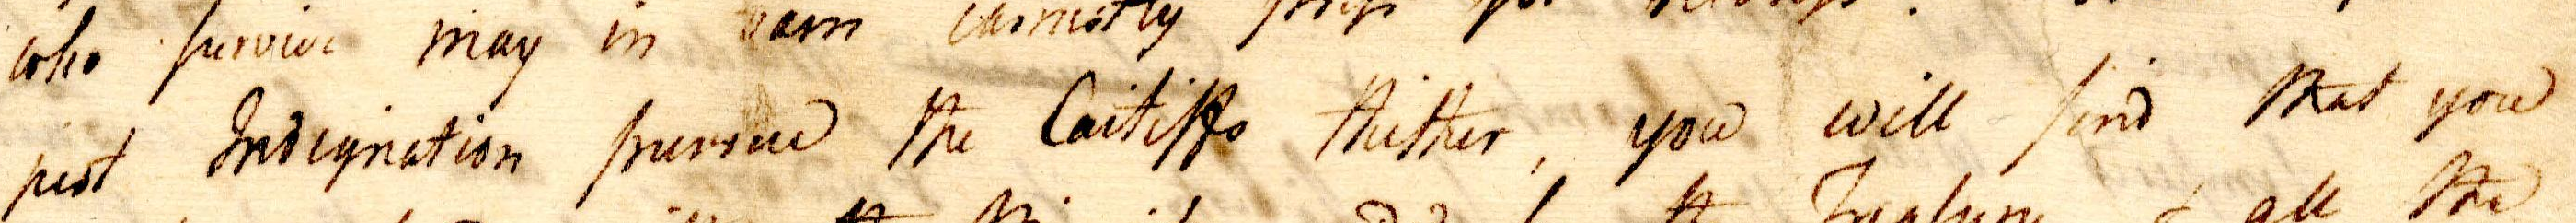past Indignation pursue the Caitiffs tither, you will find that you
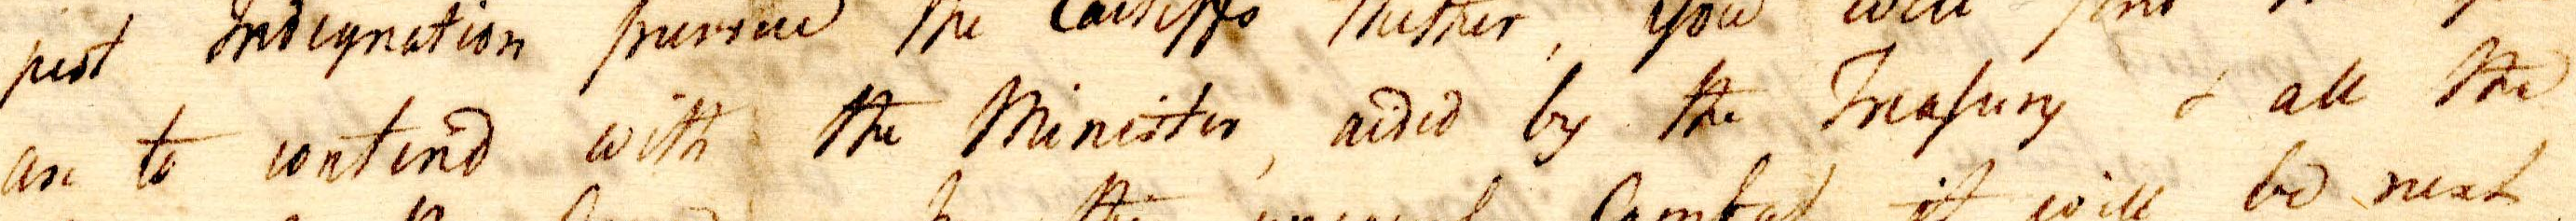are to contend with the Minister, aided by the Treasury & all the
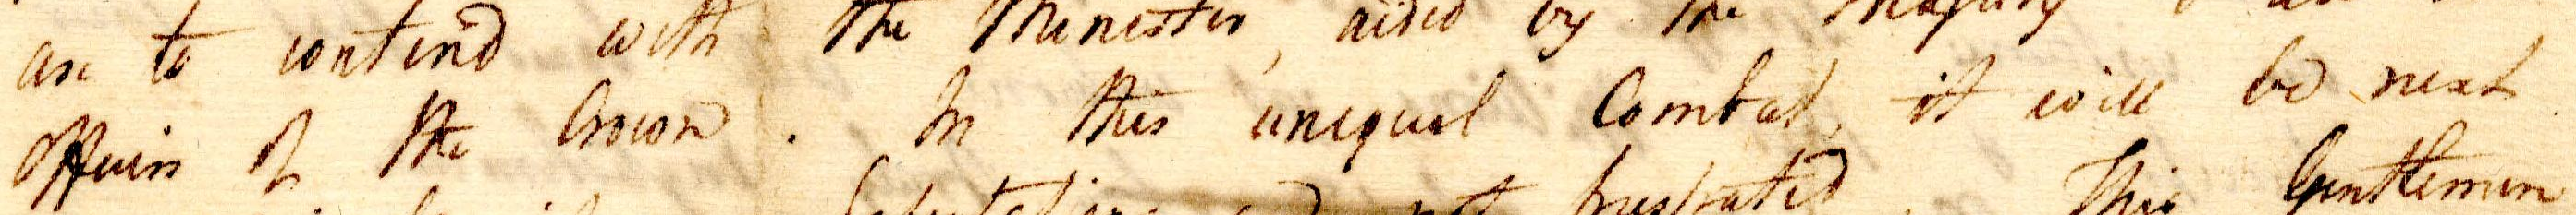Officers of the Crown. In this unequal Combat, it will be next
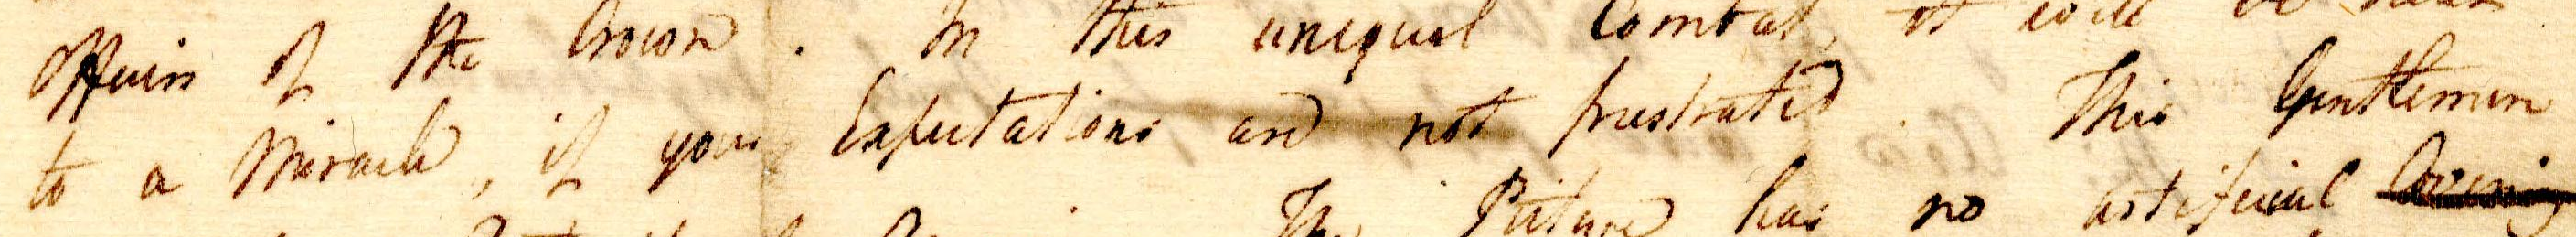to a Miracle, if your Expectations are not frustrated. This Gentlemen
